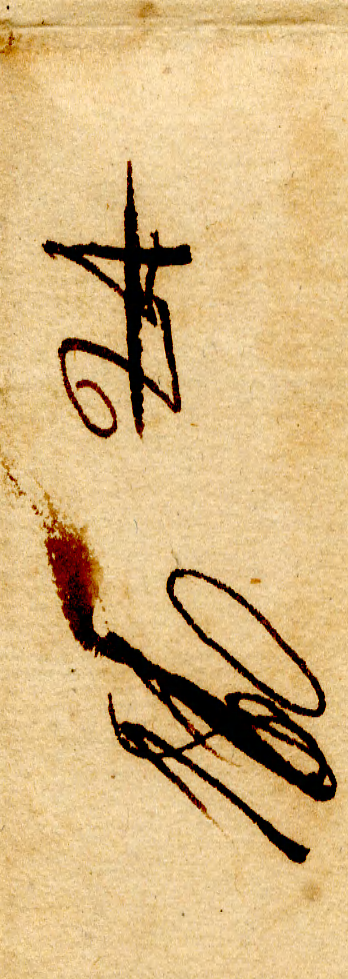160 24
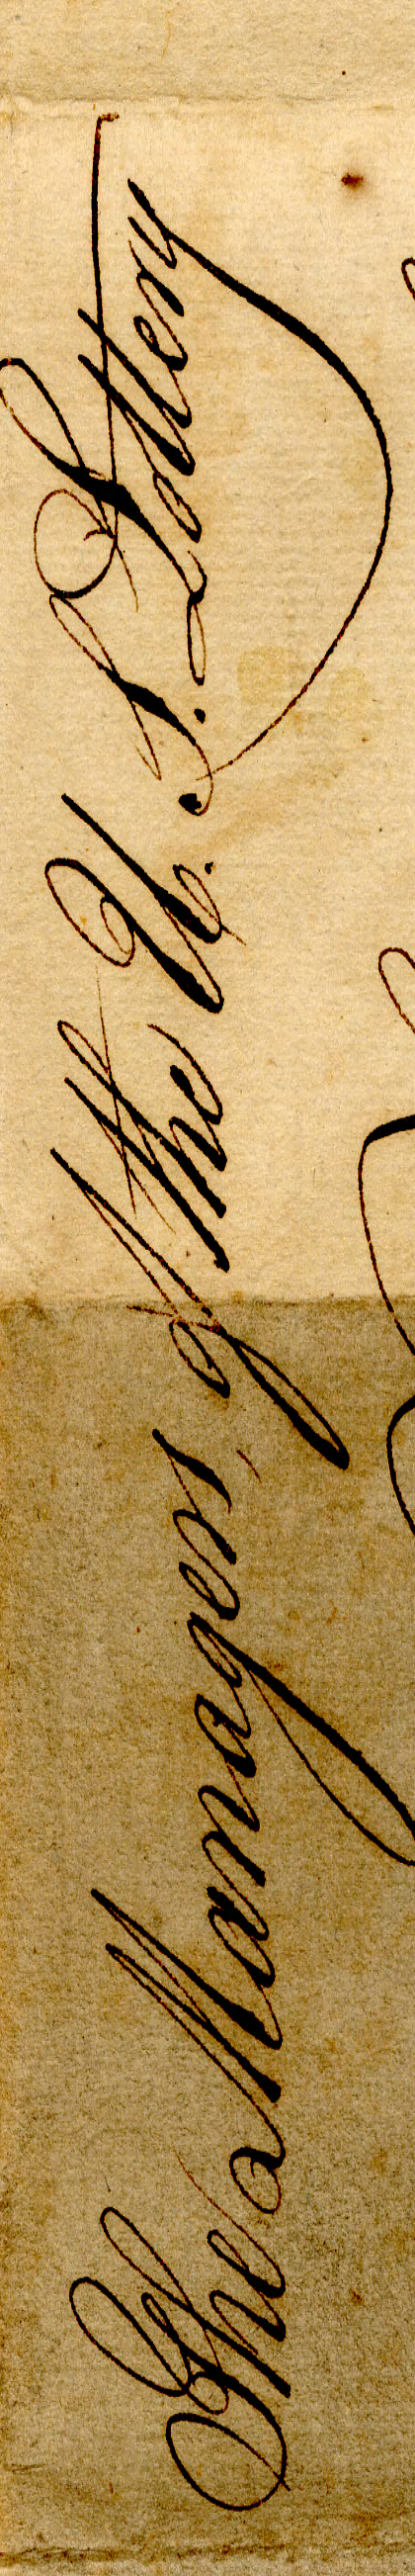The Managers of the U.S. Lottery
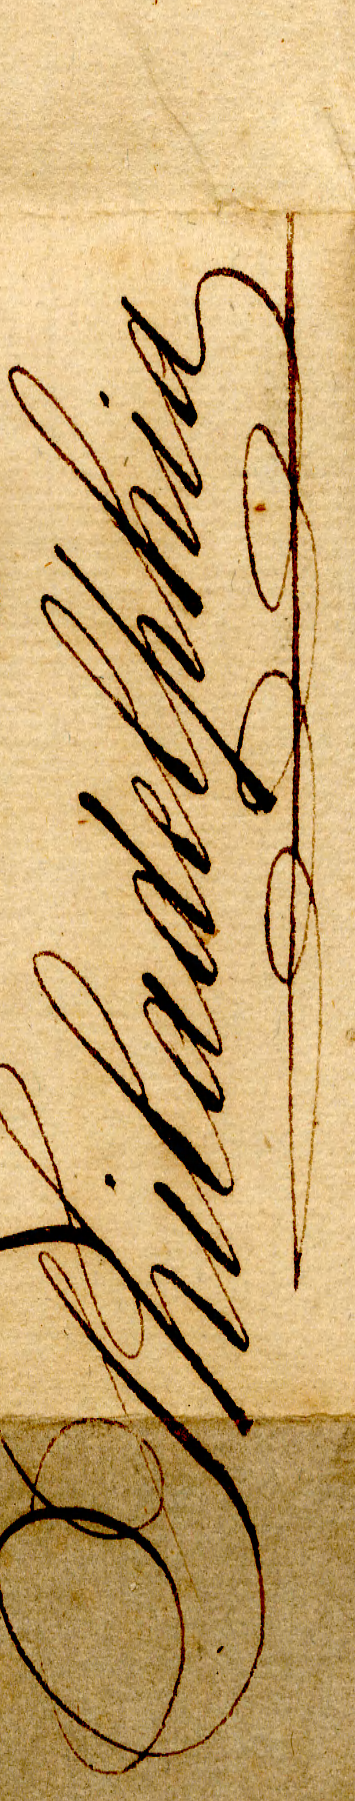Philadelphia
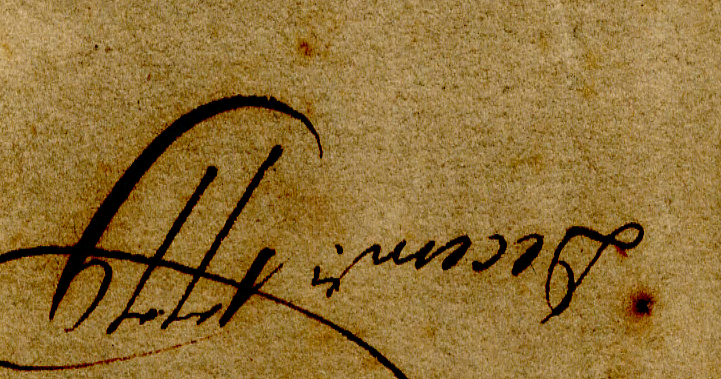Decem^r. 1779
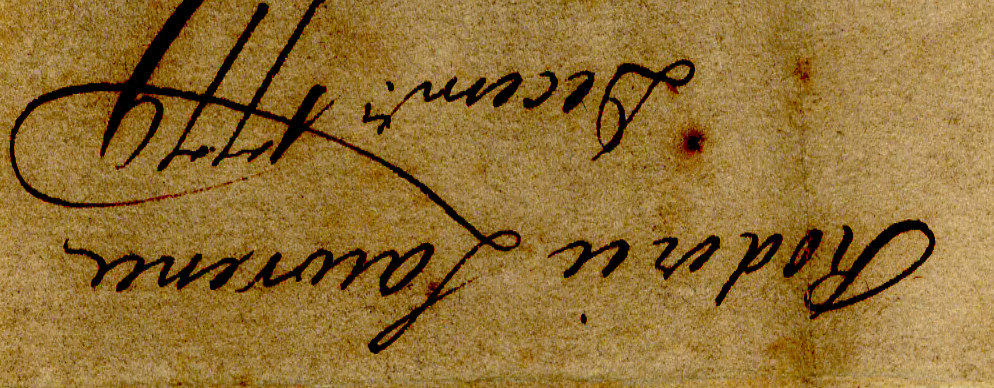Roderic Lawrence
